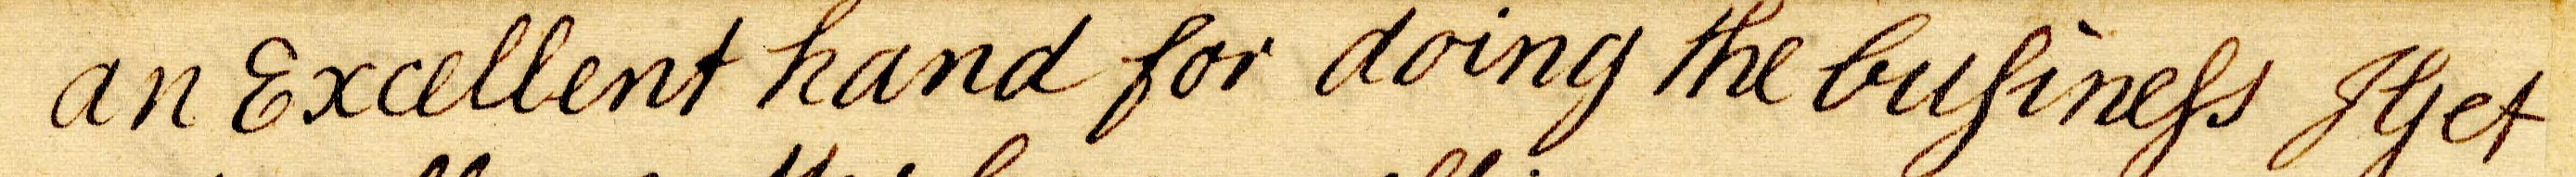an Excellent hand for doing the business I Get
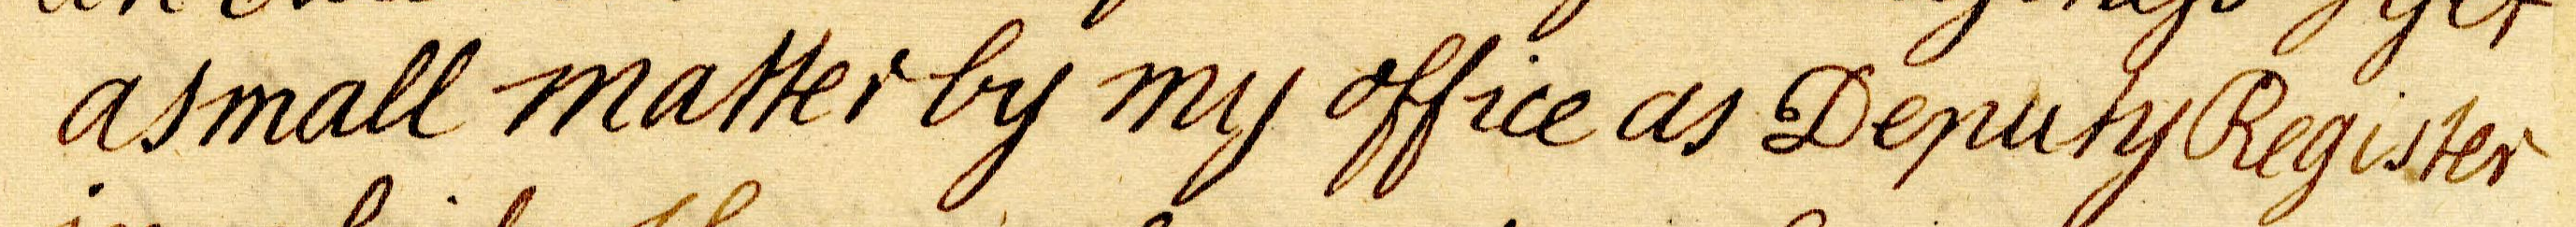A Small Matter by my office as Deputy Register
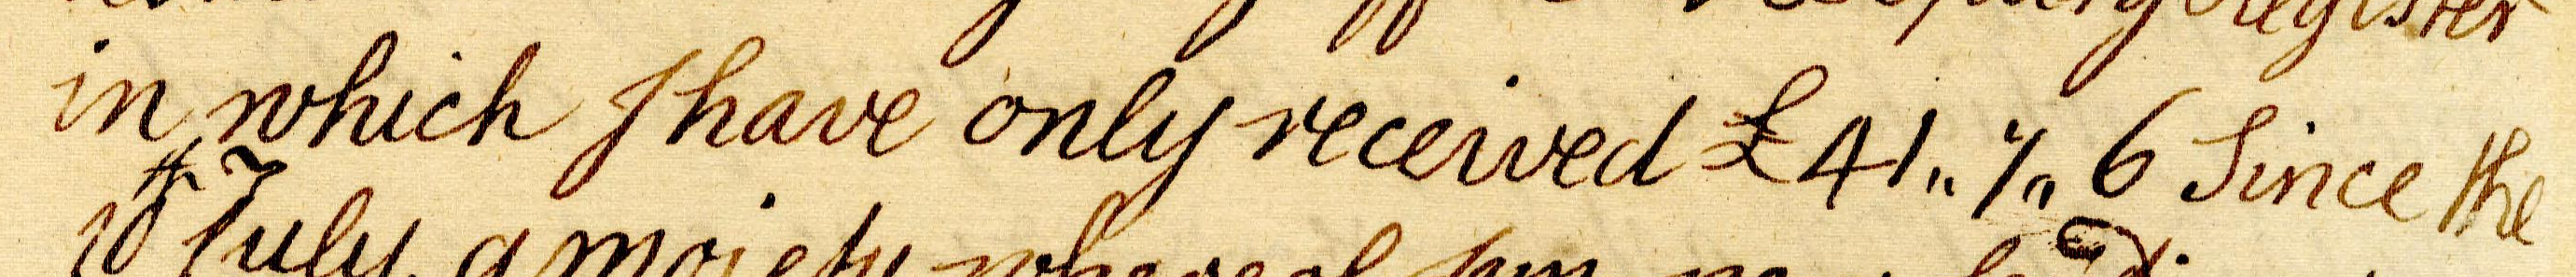in which Ihave only recerved £41.7.6 Since the
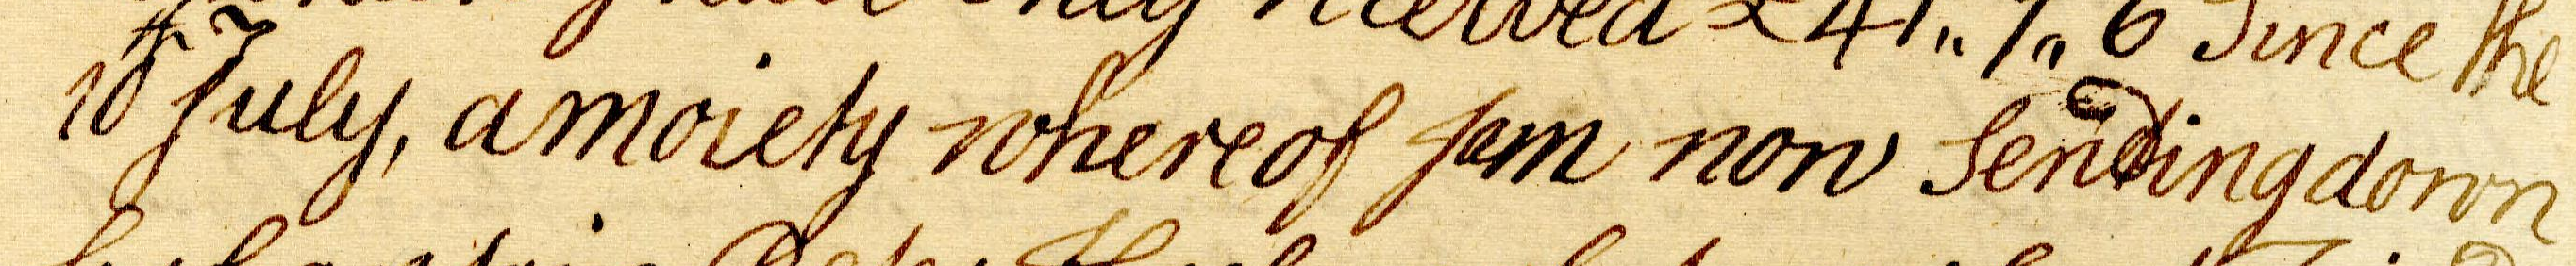10^th July, amoiety whereof I am now Sending down
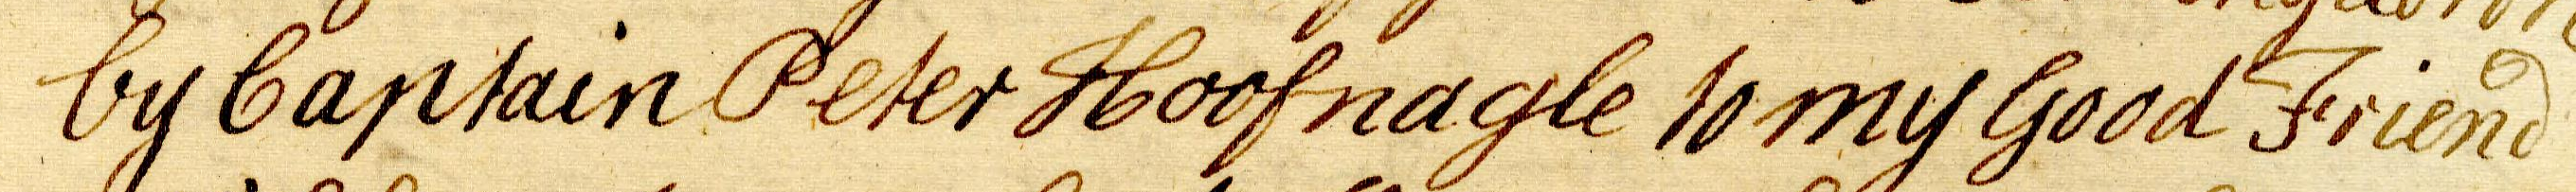by Captain Peter Hoofnagle to my Good Friend
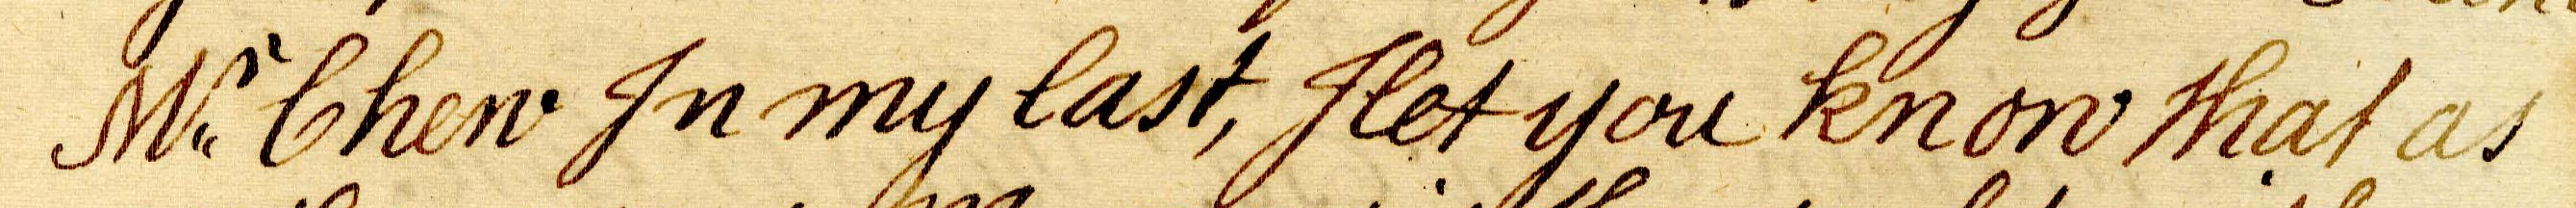M^r. Chew In my last, I let you know that as
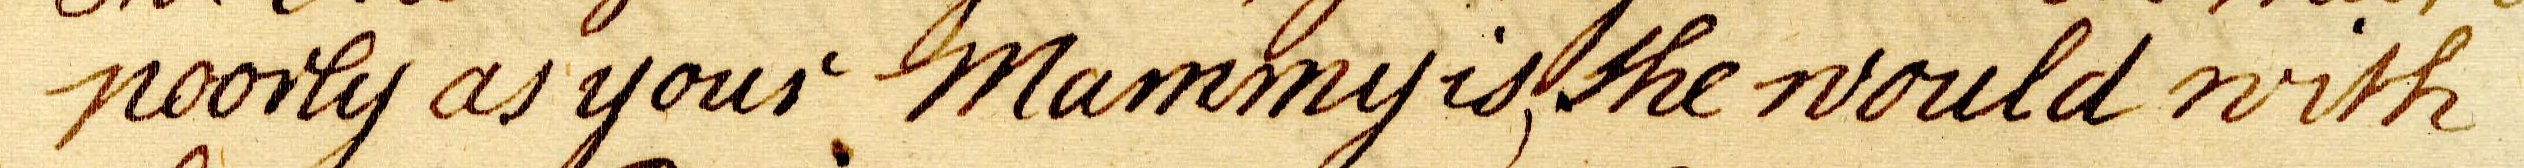poorly as your Mammy is, the would with
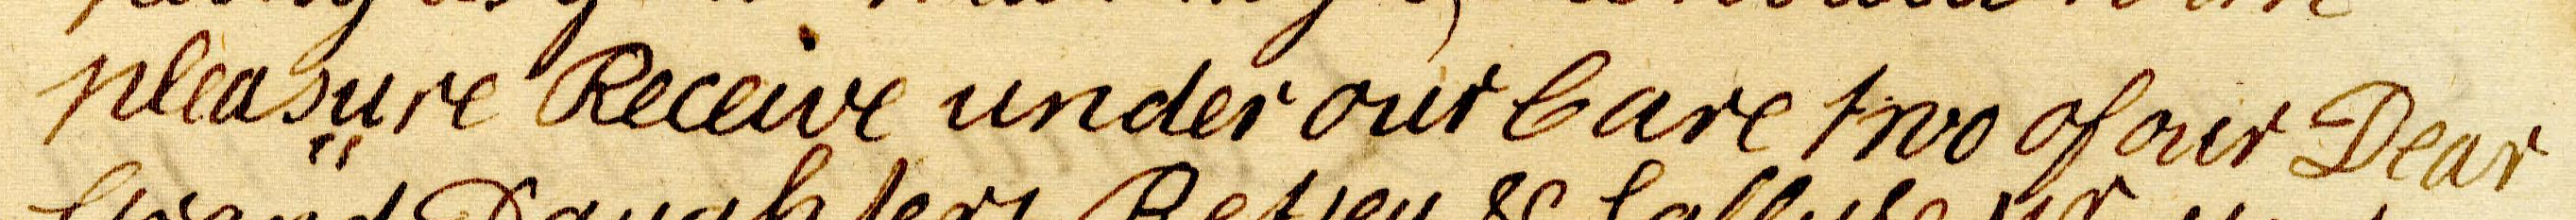pleasure Receive under our Care two of our Dear
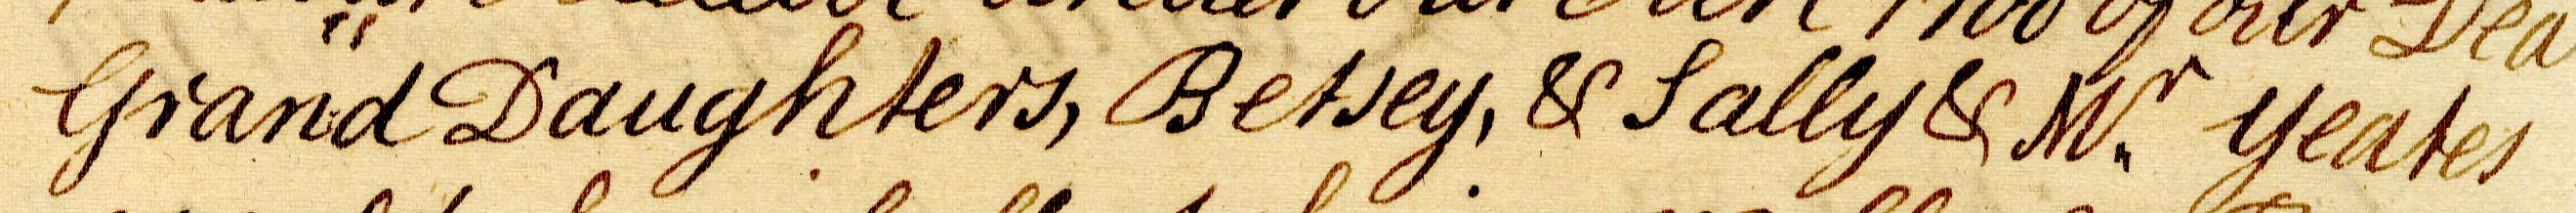Grand Daughter's, Betsey, & Sally & M^r. Yeates
